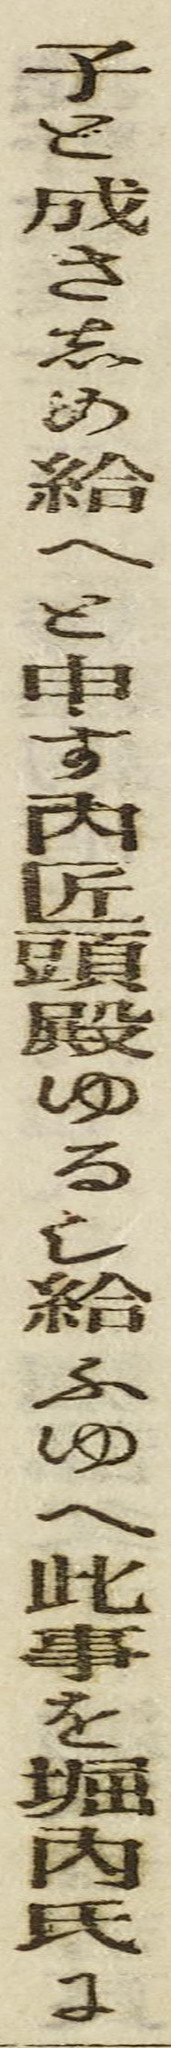子と成さしめ給へと申す内匠頭殿ゆるし給ふゆへ此事を堀内氏に
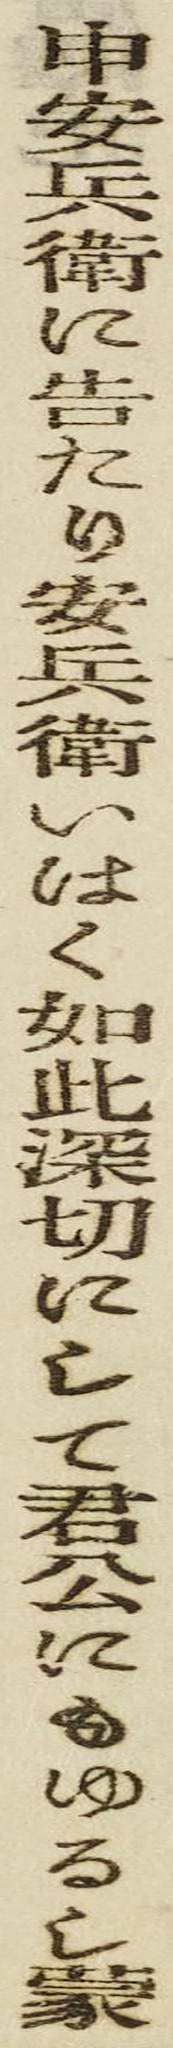申安兵衛に告たり安兵衛いはく如此深切にして君公にもゆるし蒙
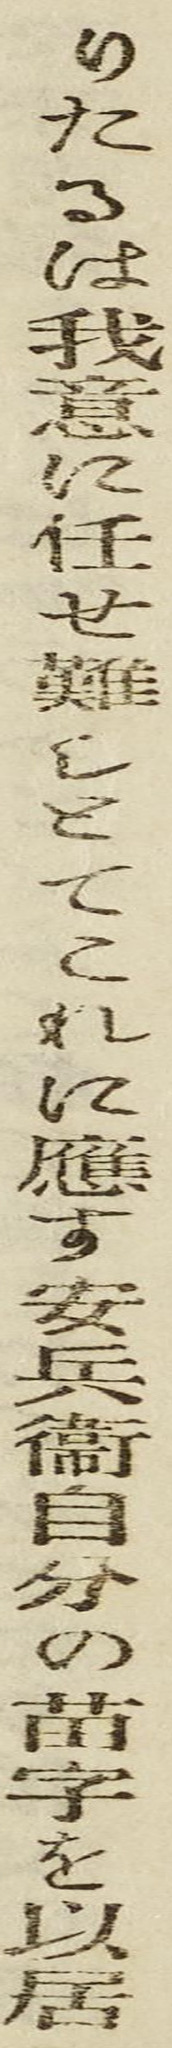りたるは我意に任せ難しとてこれに応す安兵衛自分の苗字を以居
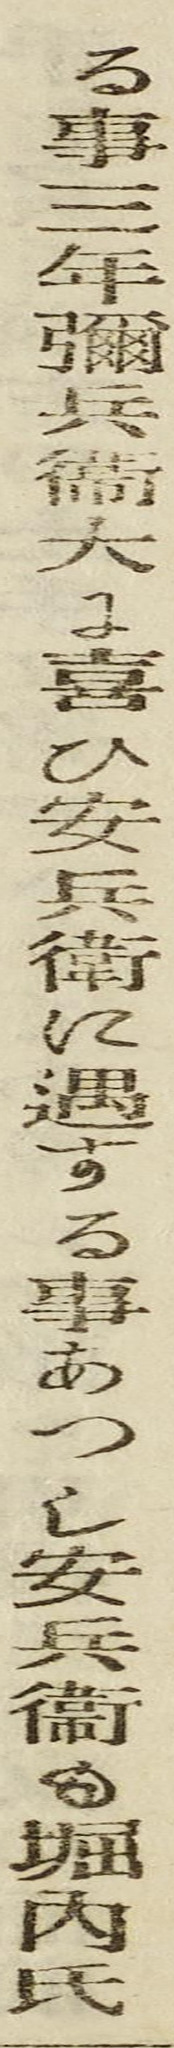る事三年弥兵衛大に喜ひ安兵衛に遇する事あつし安兵衛も堀内氏
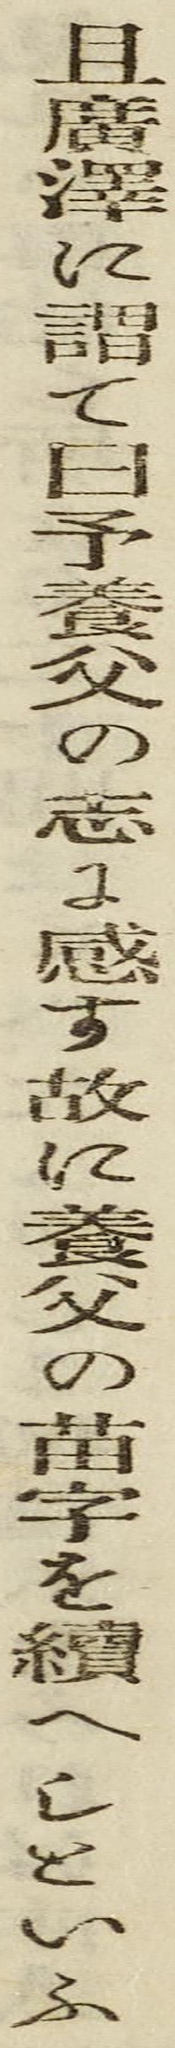且広沢に謂て曰予養父の志に感す故に養父の苗字を続へしといふ
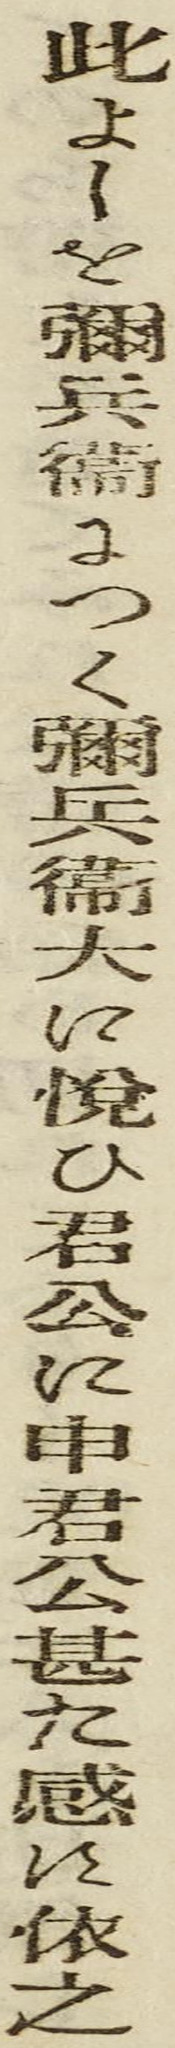此よしを弥兵衛につく弥兵衛大に悦ひ君公に申君公甚た感す依之
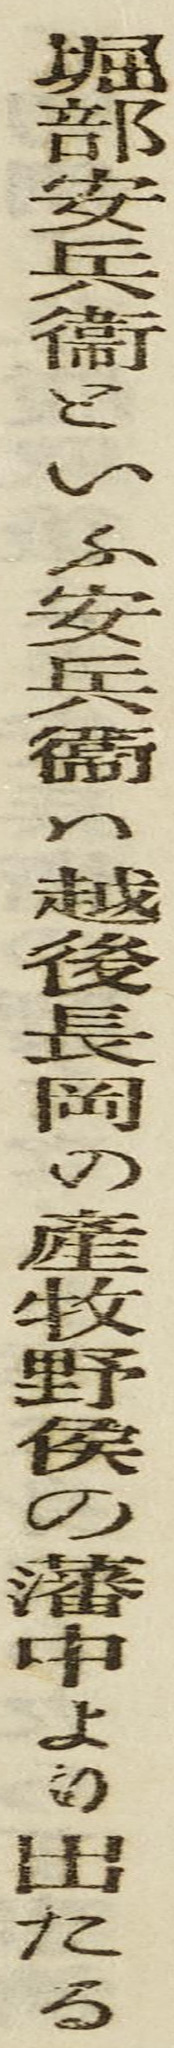堀部安兵衛といふ安兵衛ハ越後長岡の産牧野侯の藩中より出たる
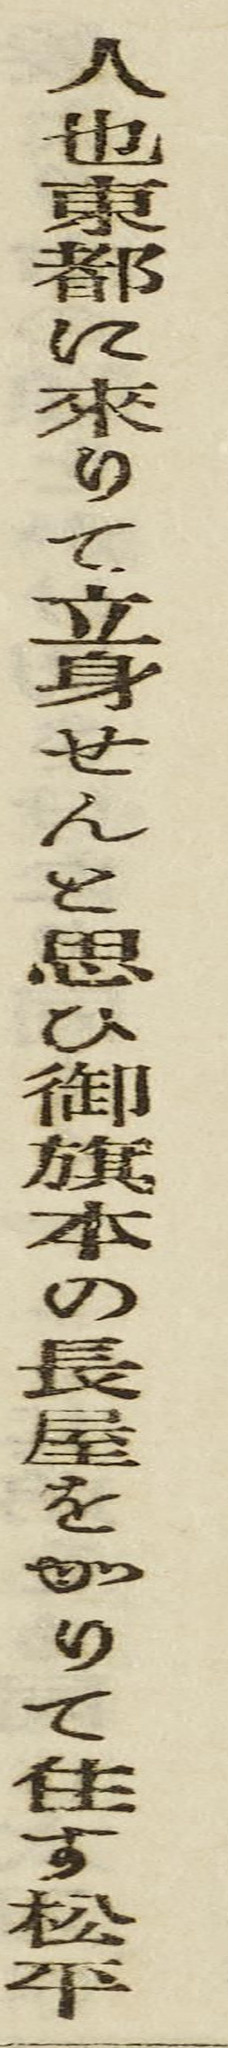人也東都に来りて立身せんと思ひ御旗本の長屋をかりて住す松平
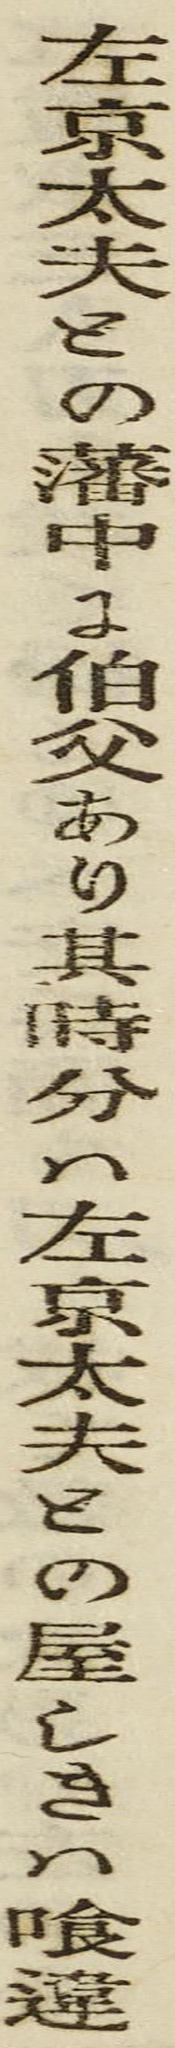左京太夫との藩中に伯父あり其時分ハ左京太夫との屋しきハ喰違
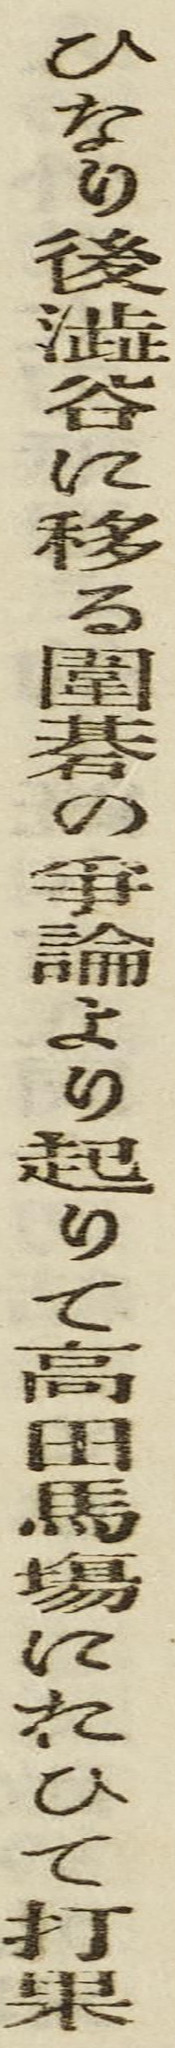ひなり後渋谷に移る囲碁の争論より起りて高田馬場において打果
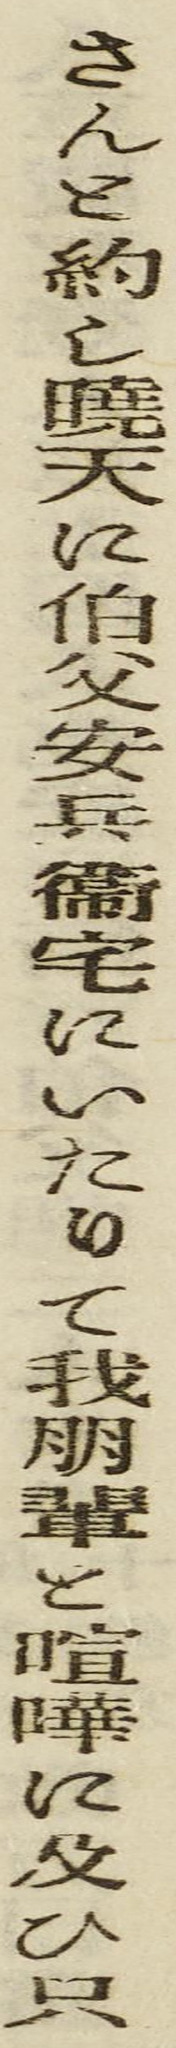さんと約し暁天に伯父安兵衛宅にいたりて我朋輩と喧嘩に及ひ只
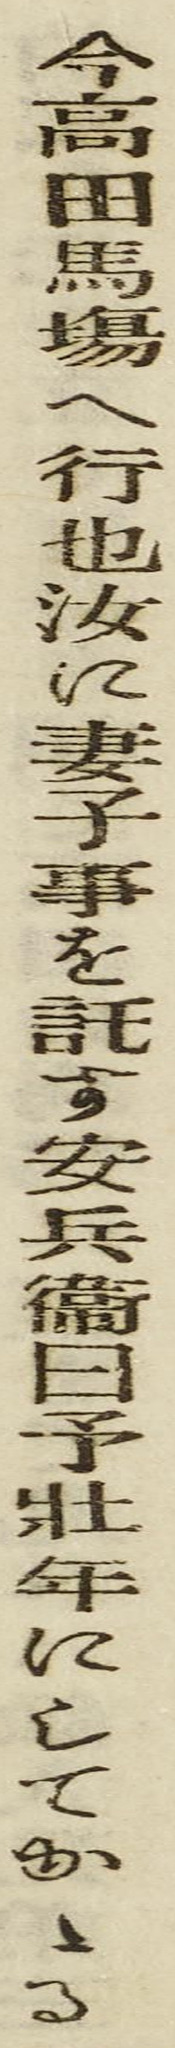今高田馬場へ行也汝に妻子事を托す安兵衛曰予壮年にしてかゝる
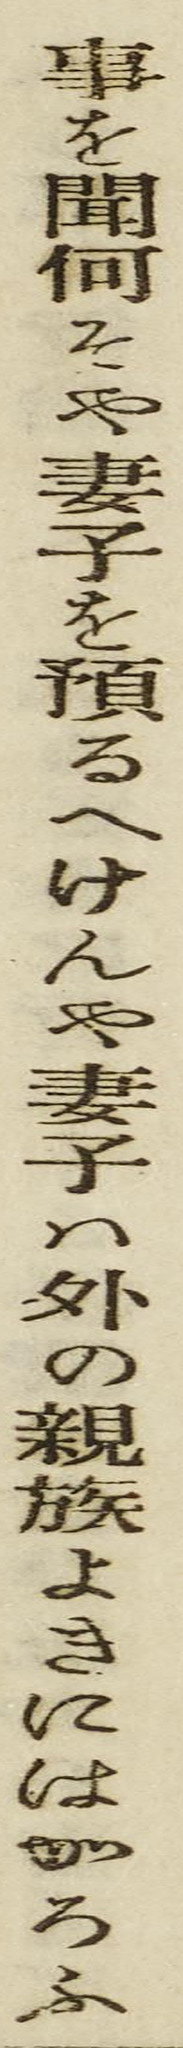事を聞何そや妻子を預るへけんや妻子ハ外の親族よきにはかろふ

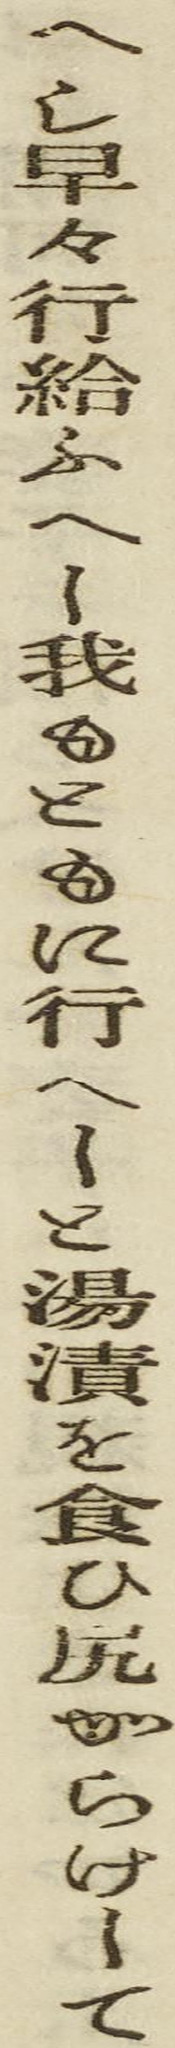へし早々行給ふへし我もともに行へしと湯漬を食ひ尻からけして
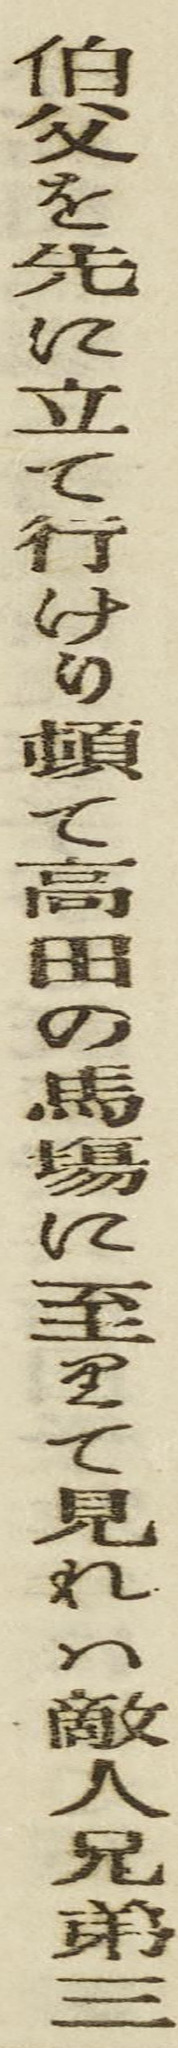伯父を先に立て行けり頓て高田の馬場に至りて見れハ敵人兄弟三
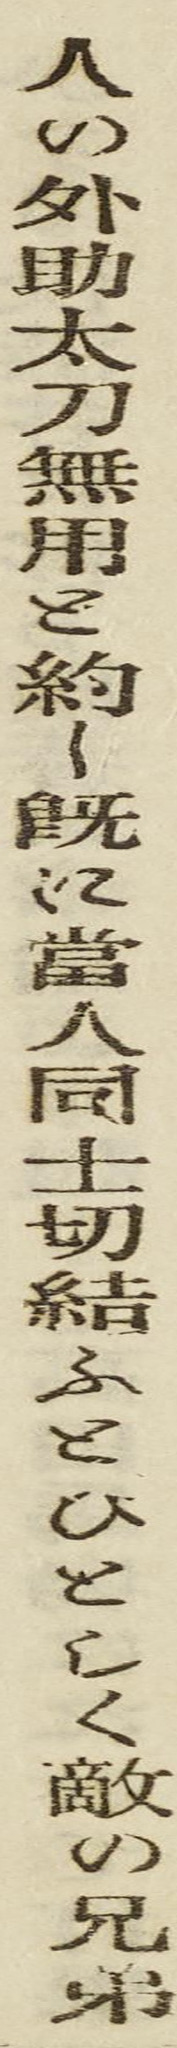人の外助太刀無用と約し既に当人同士切結ふとひとしく敵の兄弟
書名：史籍集覽　朝鮮陣古文・細井廣澤記・颶風紀事・天明七年將軍宣下次第書　全
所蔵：東京大学地震研究所図書室 Earthquake Research Institute Library, The University of Tokyo, JAPAN
